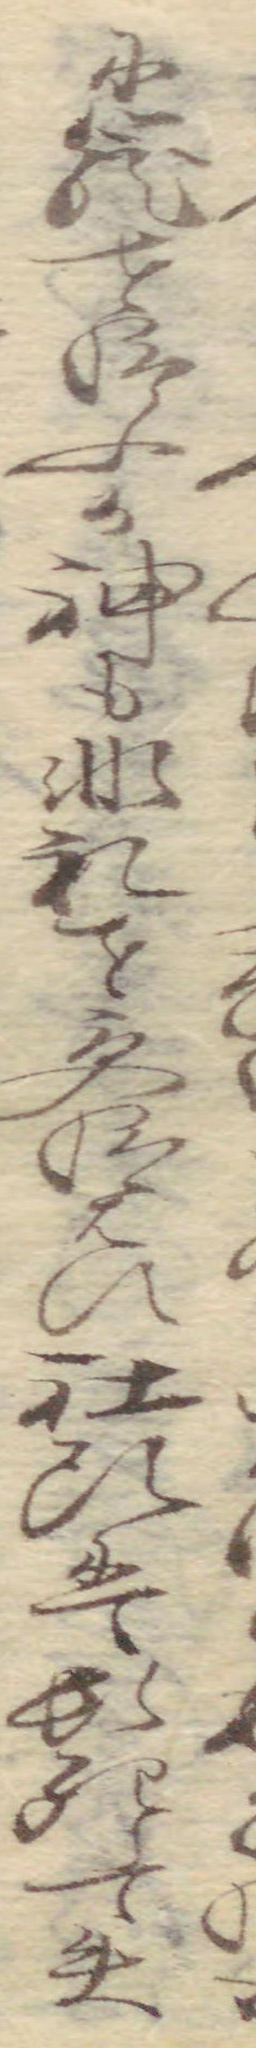に籠せ給ふか神も非礼を受給はす社頭にて頓死して失
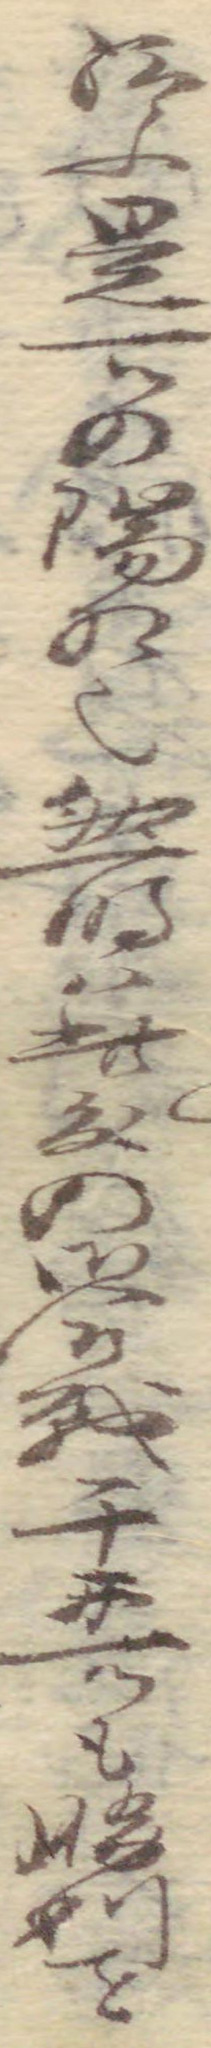給ふ是一ツの瑞相也然時は此度の御合戦千に一ツも勝利を
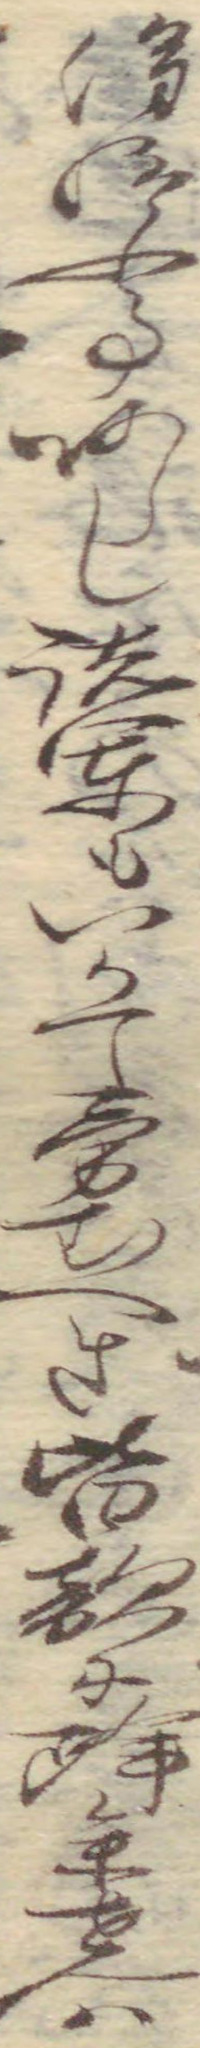得給ふ事あらし諸軍もいかて勇むへき皆敵に降参せんは
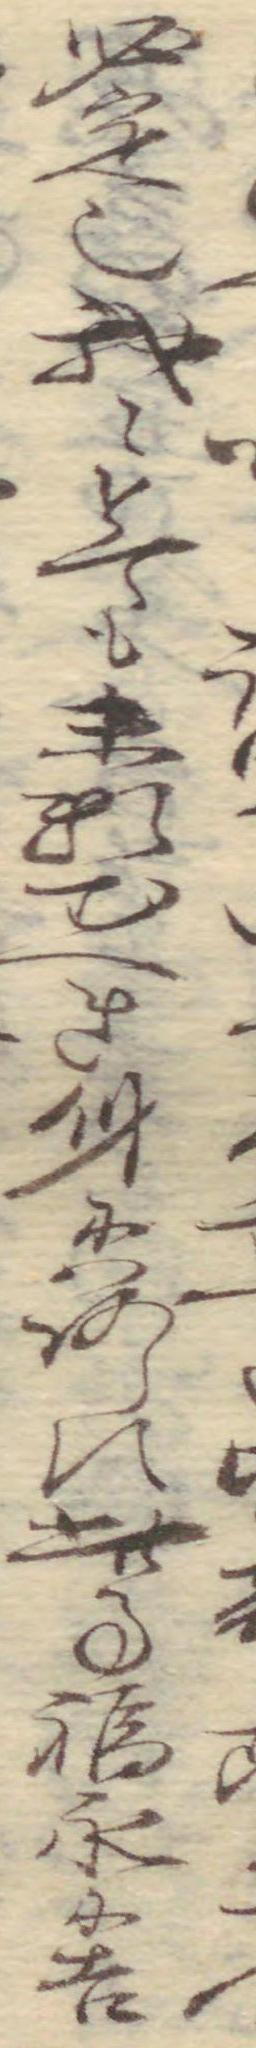必定也我々とても未頼むへき身にはあらす此事福永に告
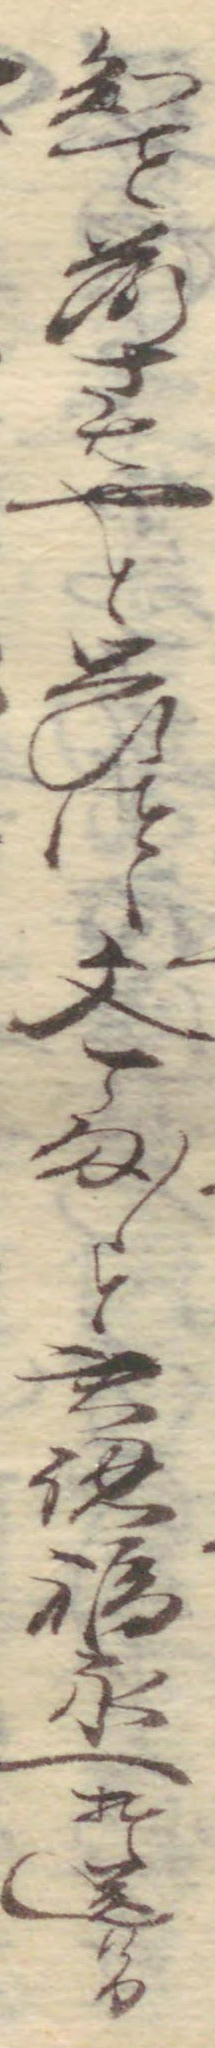知せ落さはやと思ひつゝ文こま〳〵と書認福永へそ送ける
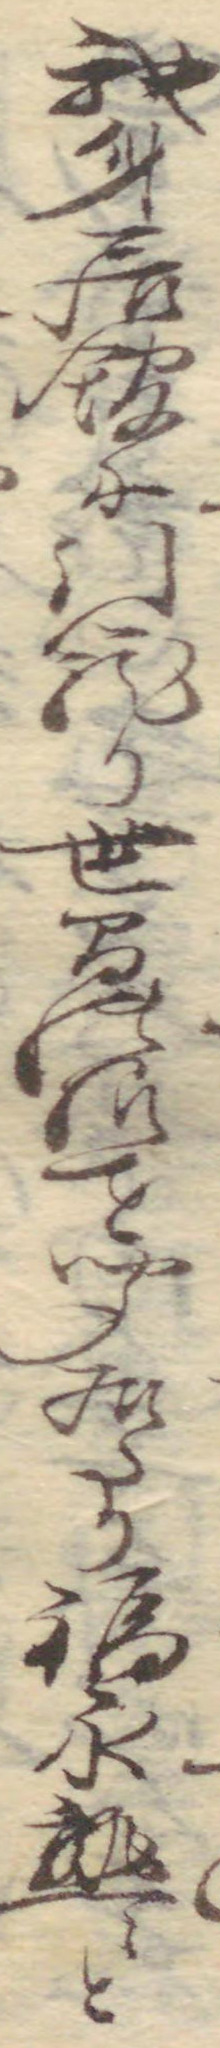我身居館に引籠り世間の様を聞居たり福永熟々と
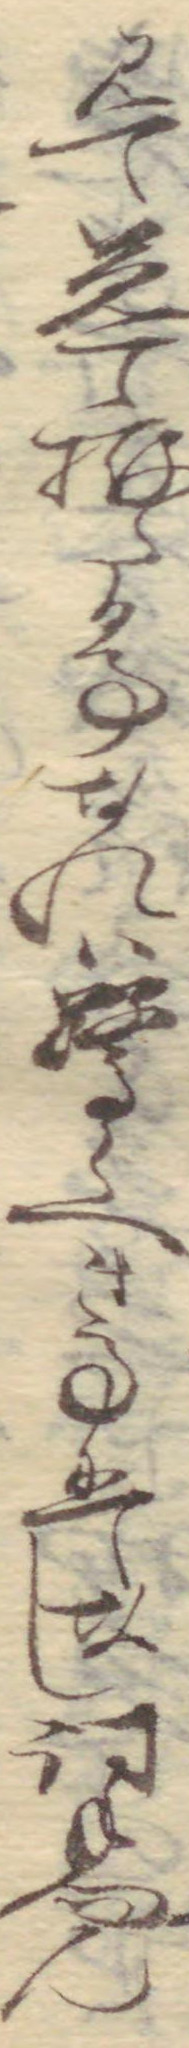見て覚て拵たる事なれは驚くへき事にてなし討手向ん
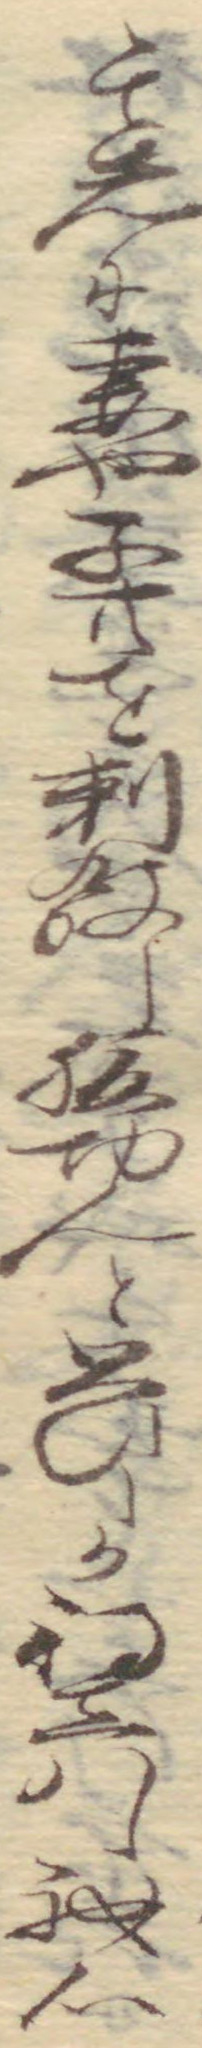其先に妻や子共を刺殺し腹切んと思ひしか待しはし我心
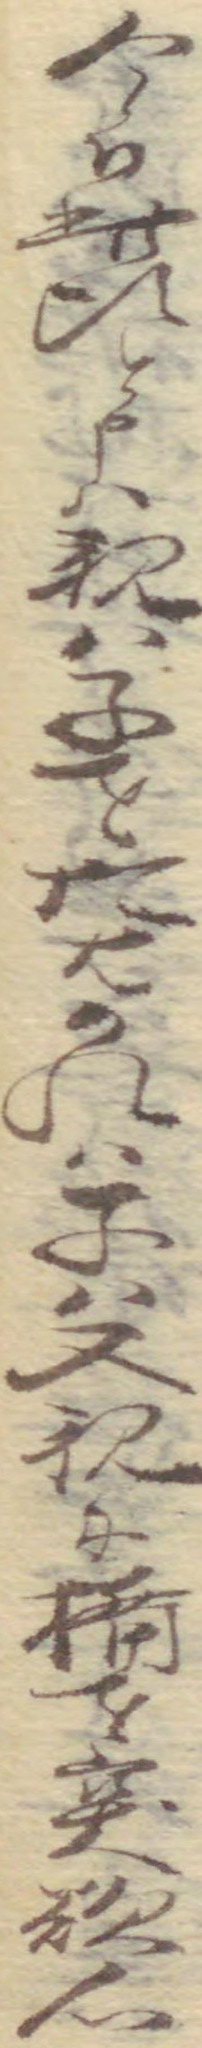今日此頃と申は親は子をたはかれは子は又親に楯を突欲心
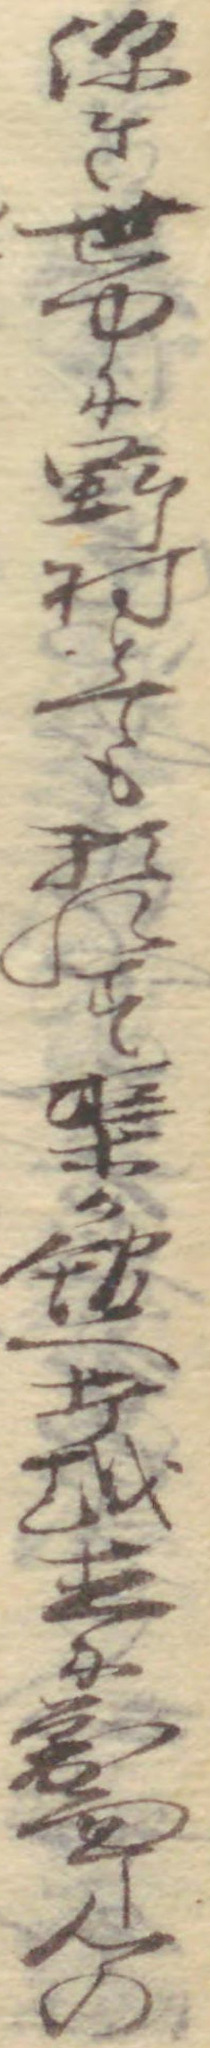深き世中に野村とても頼れす渠か館へ打越直に対面し心の
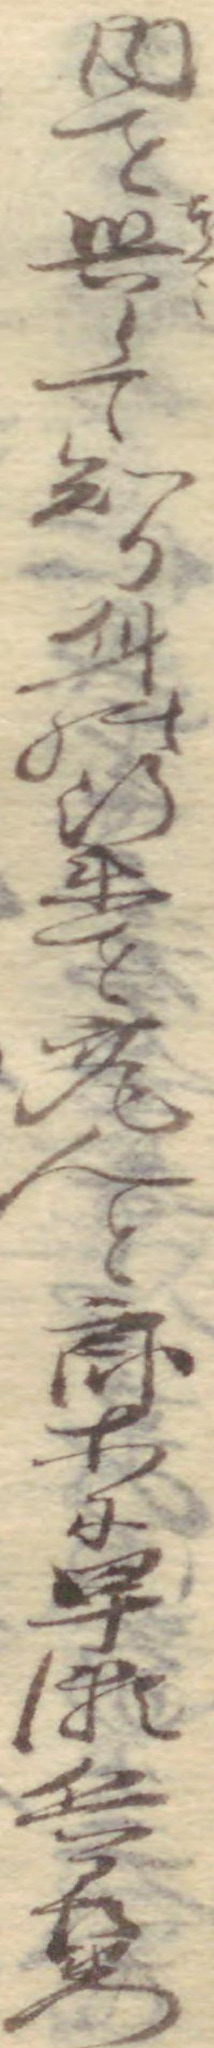内を興して知り身の行衛を究んと郎等に早瀬兵部左衛門
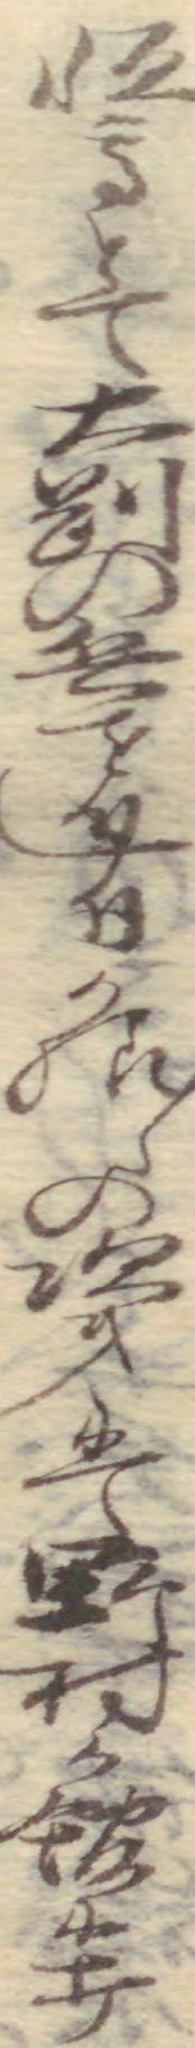恒高とて大剛の兵を近付か様〳〵の次第にて野村か館に打
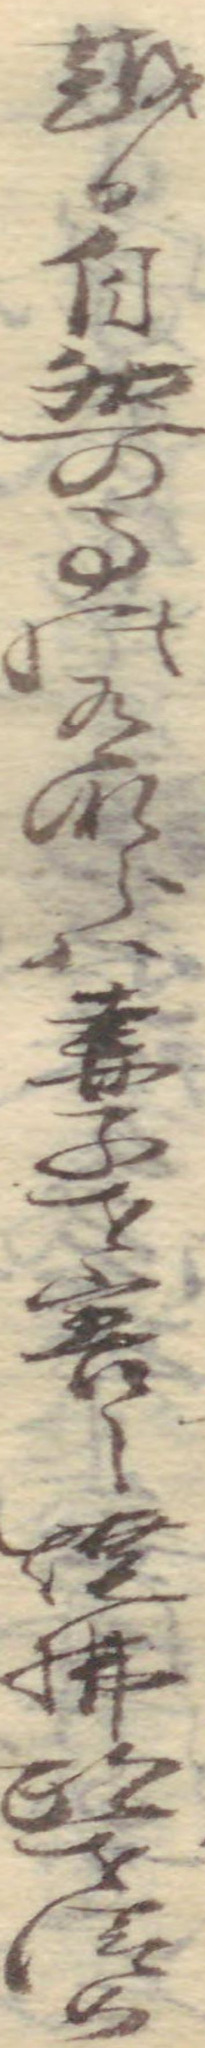越か自然の事の有ならは妻子を害し焼払跡を清め
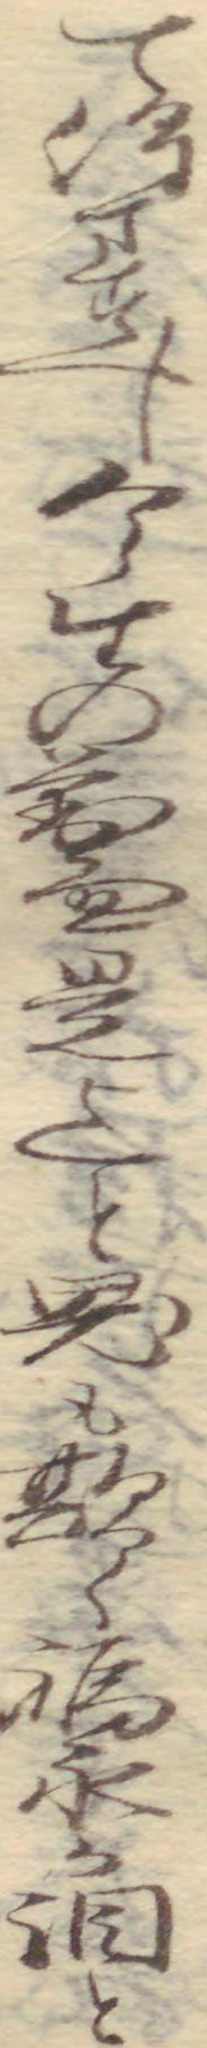て得さすへし今生の対面是迄と鬼も欺く福永か泪と
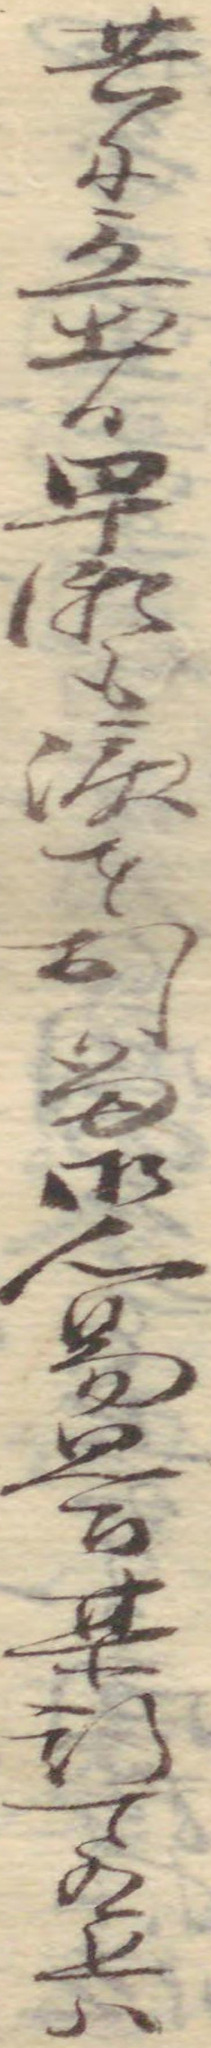共に立出る早瀬も涙をおし留御心易思召某斯て有上は
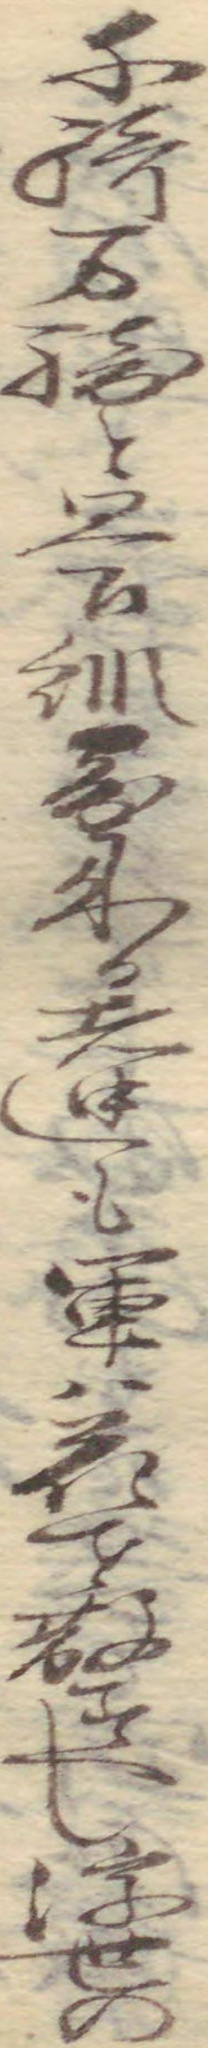千騎万騎と思召縦寄来る者迚も軍は花を散すへし浮世の
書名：鶯宿雑記. 巻199-200
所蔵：国立国会図書館 National Diet Library, JAPAN
